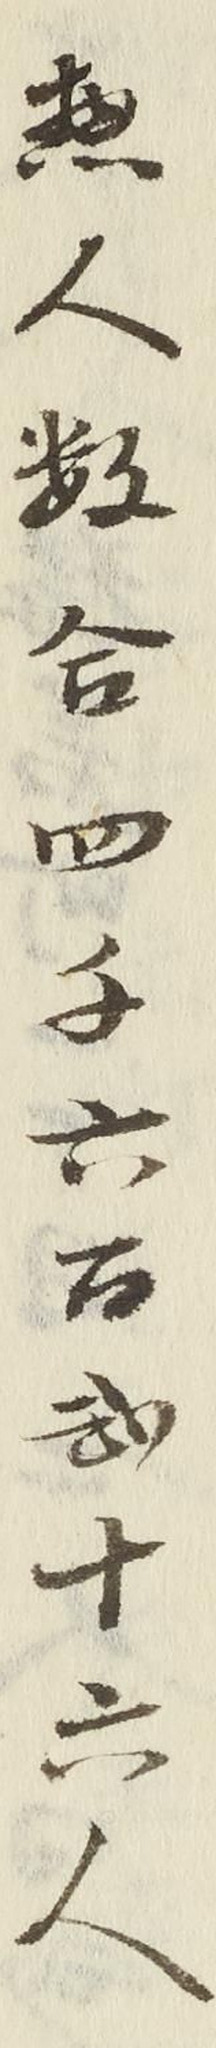惣人数合四千六百弐十六人
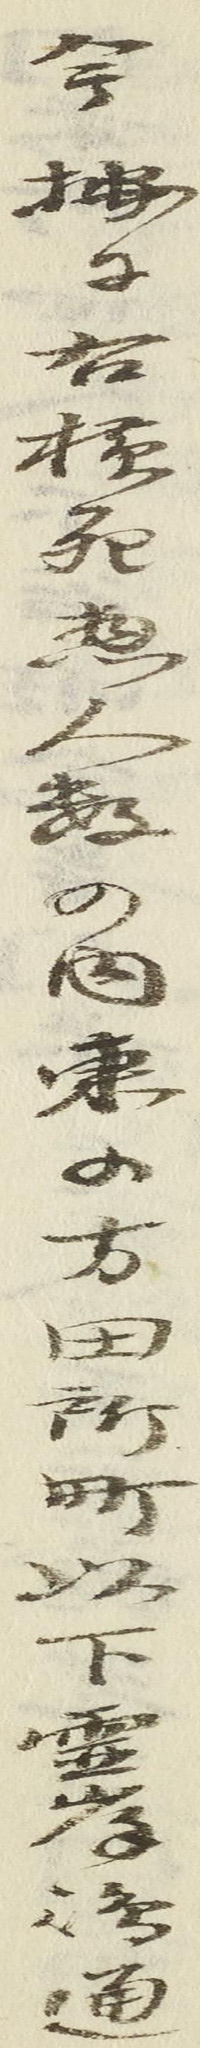今按に右衛門横死惣人数の内東の方田所町以下霊岸嶋通
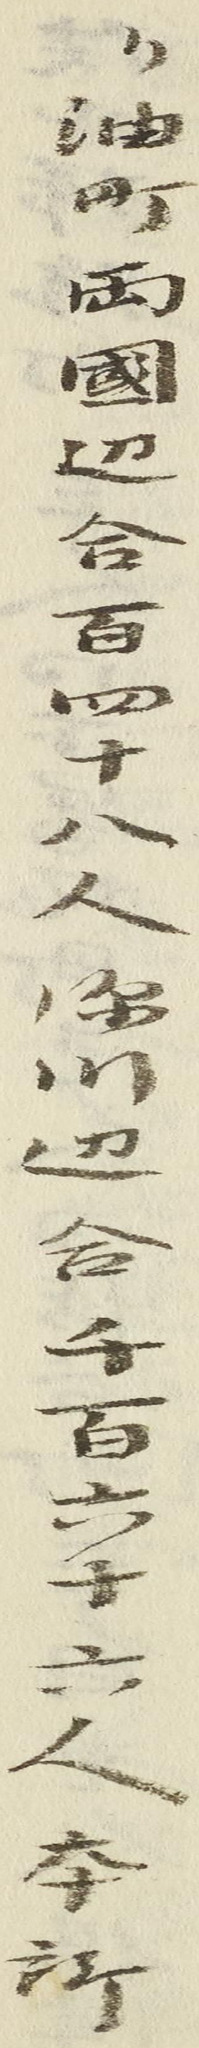り油町両国辺合百四十八人深川辺合千百六十六人本所
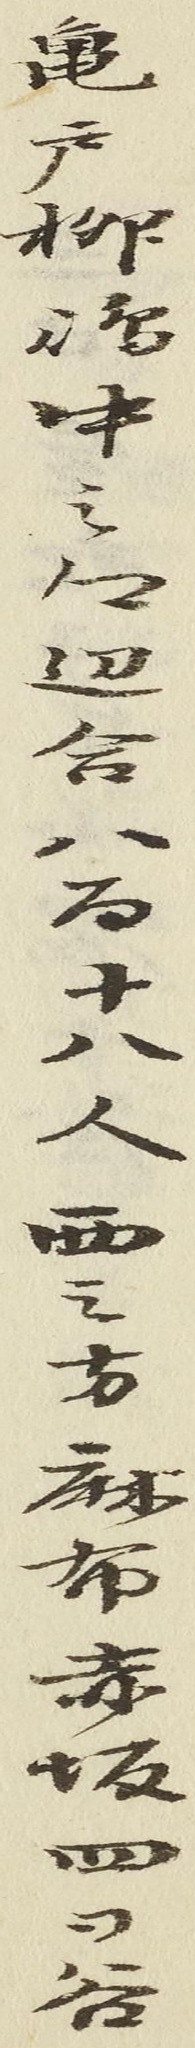亀戸柳嶋中之郷辺合八百十八人西之方麻布赤坂四ッ谷
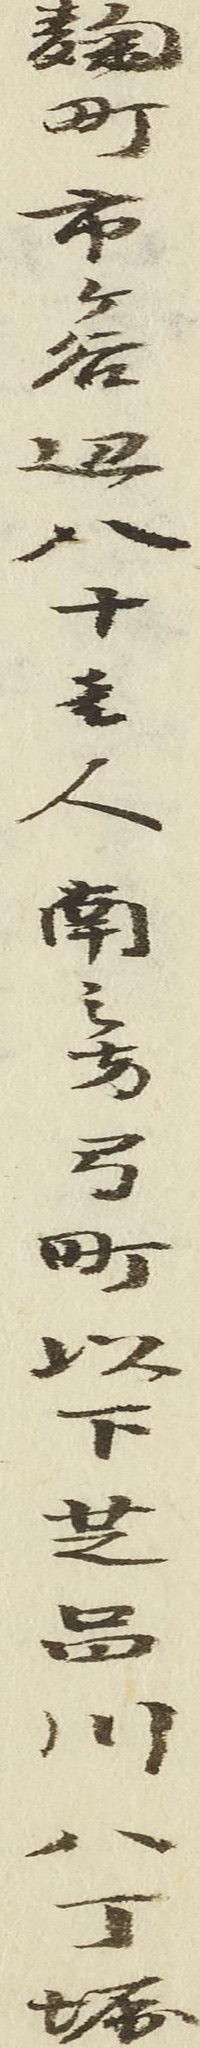麹町市ヶ谷辺八十壱人南之方弓町以下芝品川八丁堀
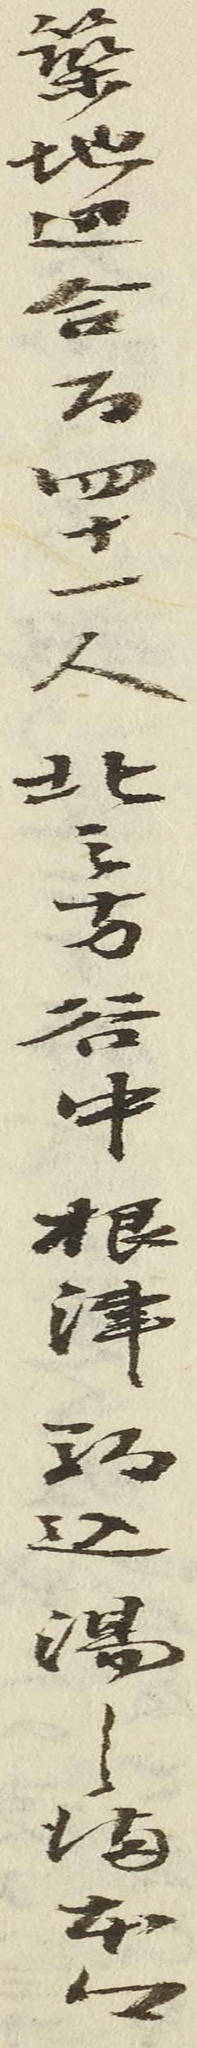築地辺合百四十一人北之方谷中根津駒込湯しま本郷
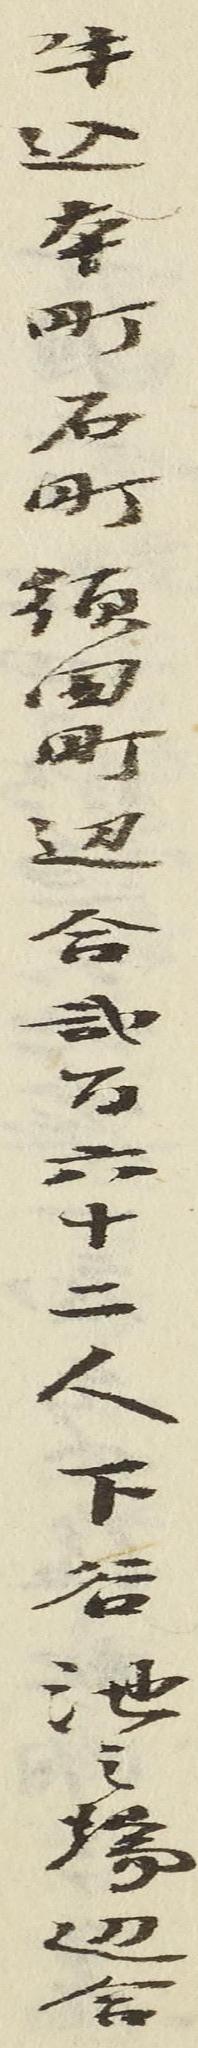牛込本町石町須田町辺合弐百六十二人下谷池之端辺合
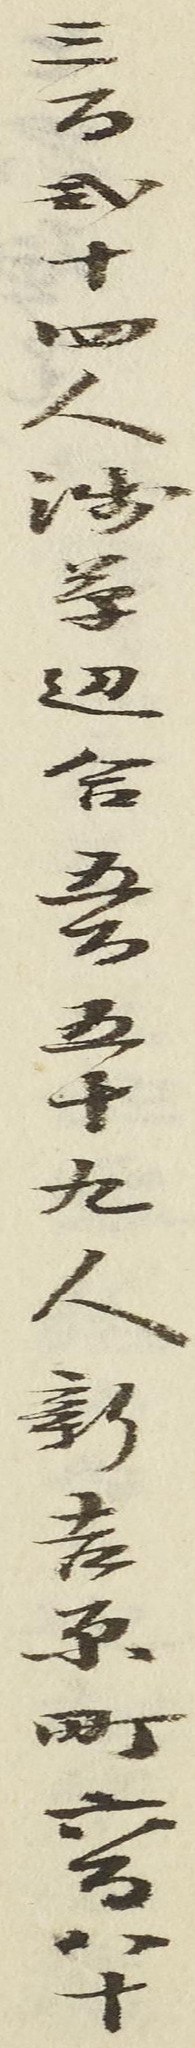三百弐十四人浅草辺合五百五十九人新吉原町六百八十
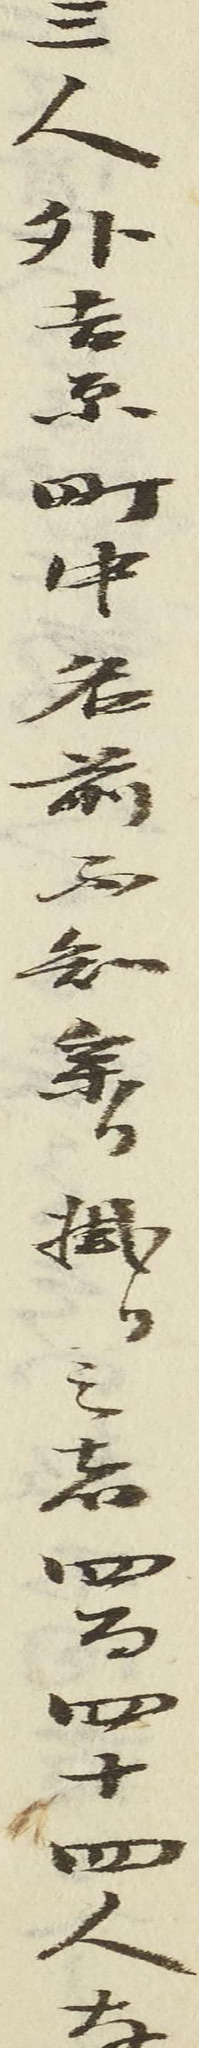三人外吉原町中名前不知参り掛り之者四百四十四人な
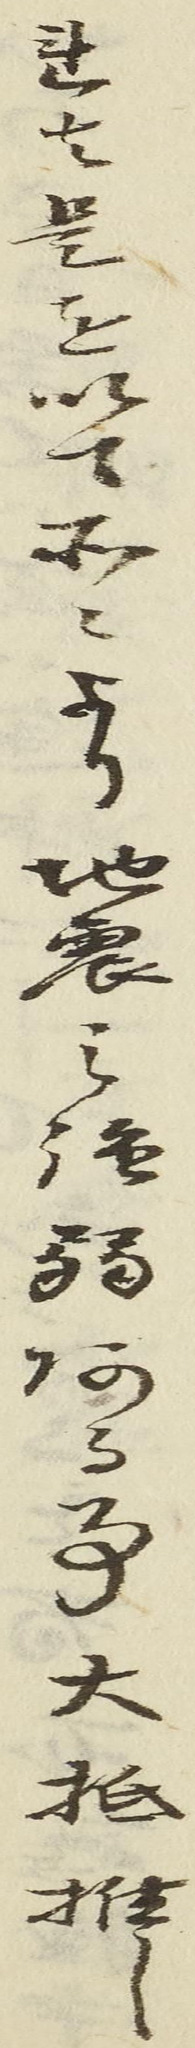れは是を以て所々より地震之強弱ある事大低推し
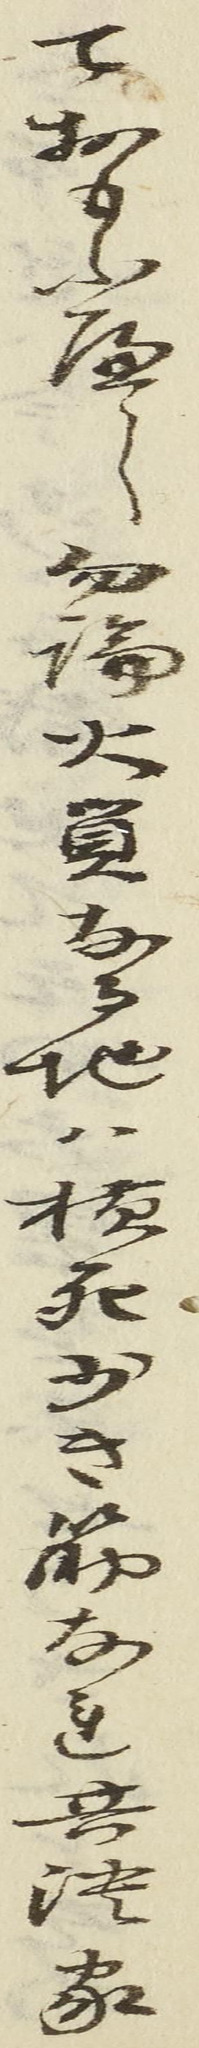ておもふへし勿論火災なる地ハ横死少き筋なれ共潰家
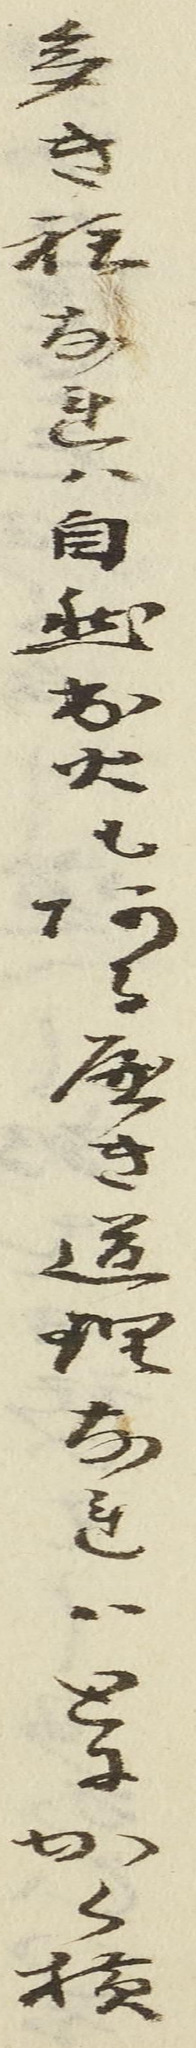多き程なれハ自然出火もあるへき道理なれハとにかく横
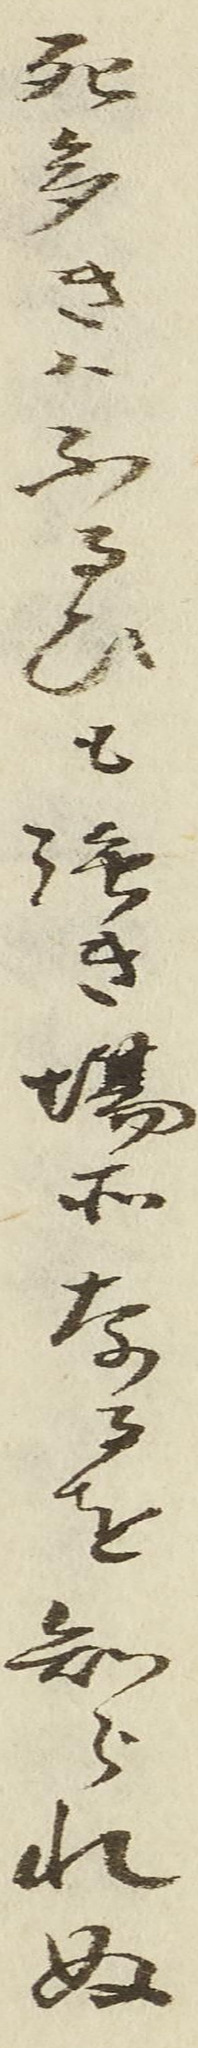死多きハふるひも強き場所なるを知られぬ

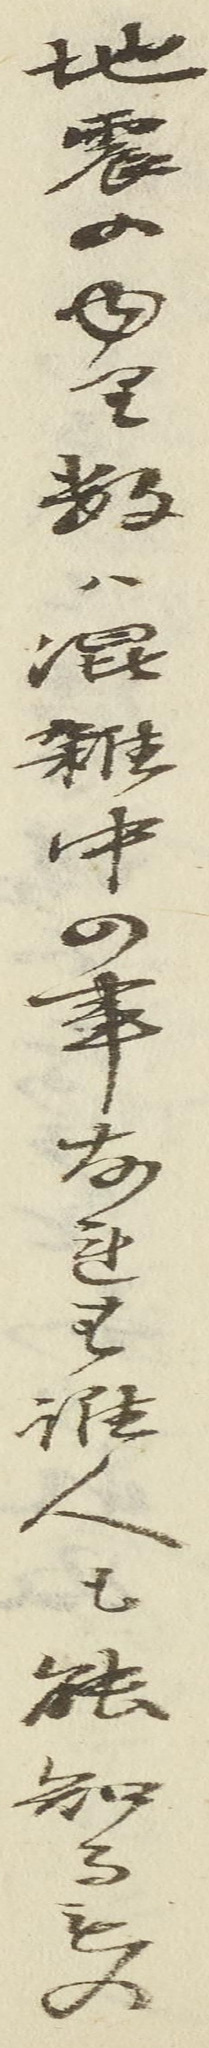地震のゆり数ハ混雑中の事なれは誰人も能知るもの
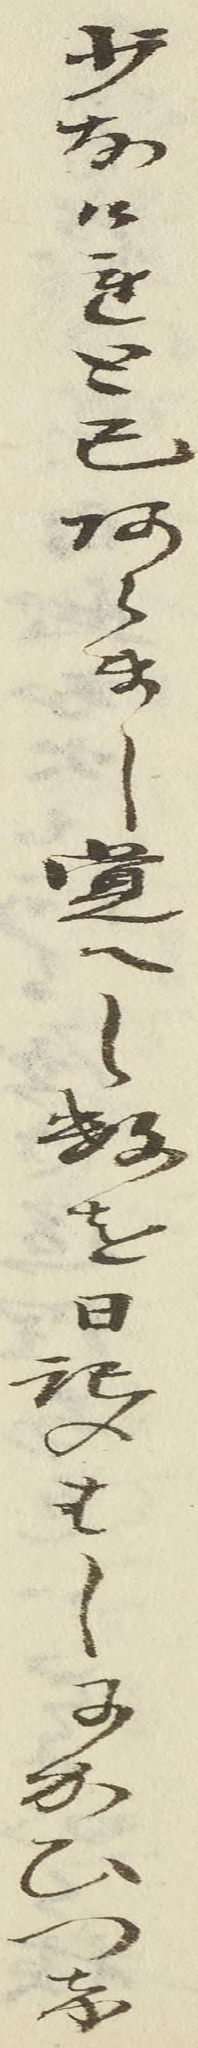少なけれと己あらまし覚へし数を日記のはしにかひつけ
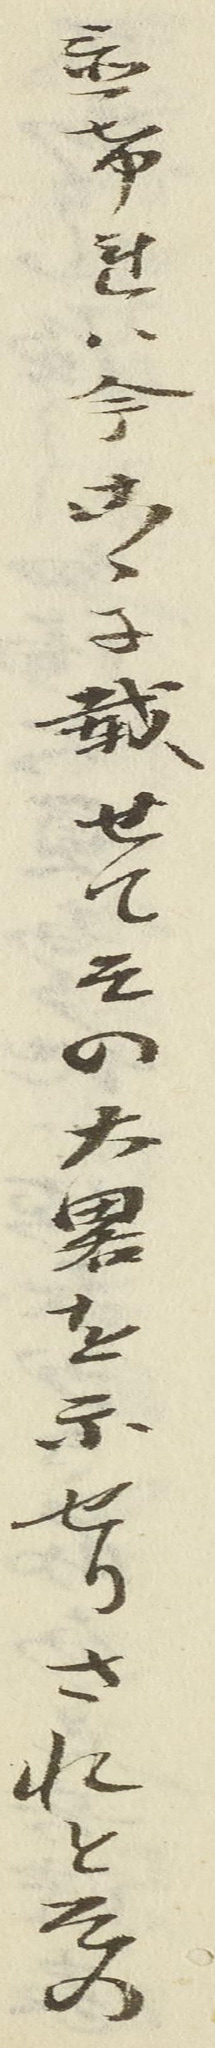置けれハ今こゝに載せてその大畧を示せりされとその
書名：那為の後見艸　全
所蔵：東京大学地震研究所図書室 Earthquake Research Institute Library, The University of Tokyo, JAPAN
